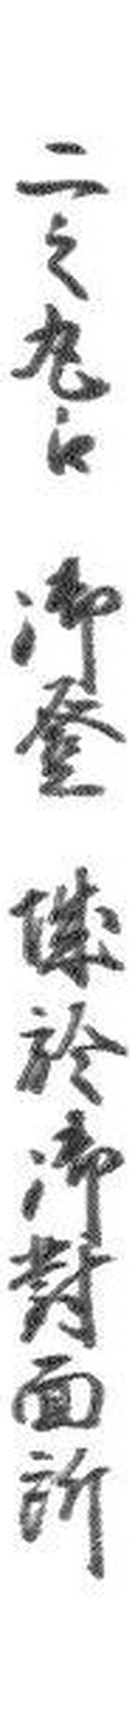二之丸江御登城於御対面所
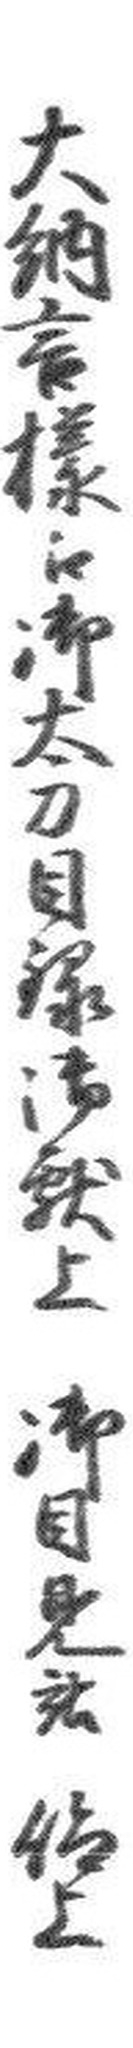大納言様江御太刀目録御献上御目見被仰上
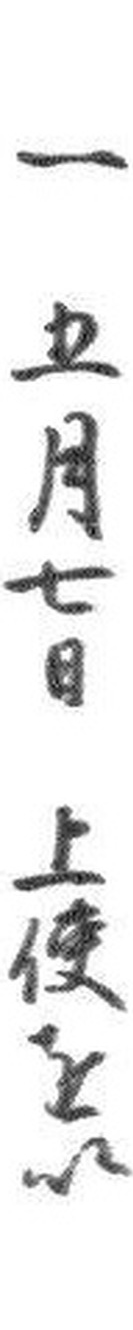一五月七日上使を以

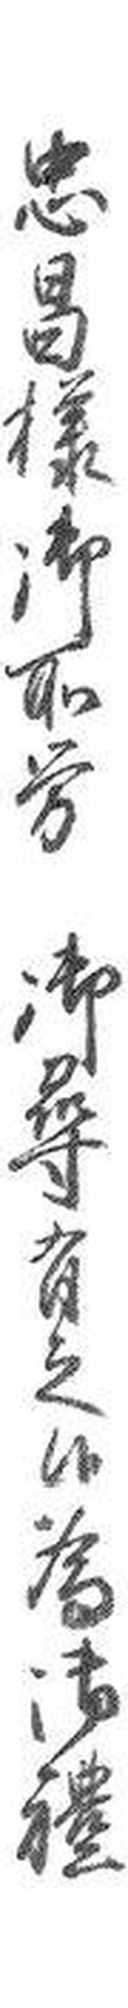忠昌様御所労御尋有之候為御礼
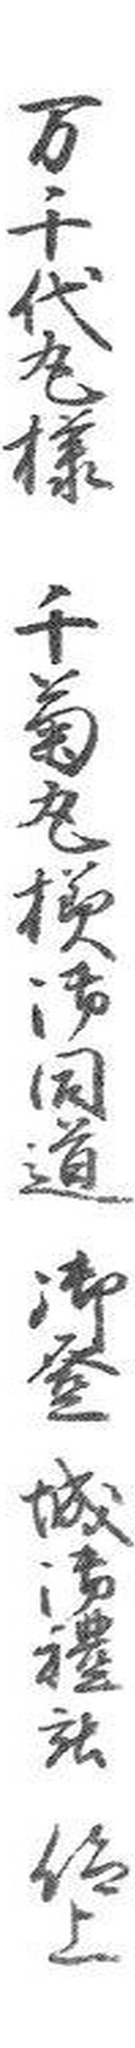万千代丸様千菊丸様御同道御登城御礼被仰上
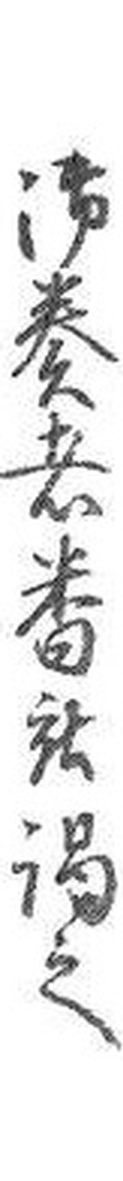御奏者番被謁之
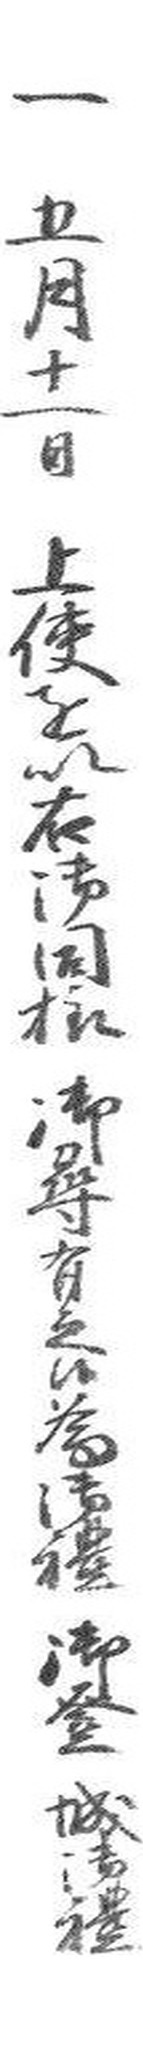一五月十一日上使を以右御同様御尋有之候為御礼御登城御礼
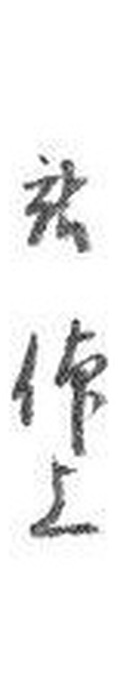被仰上
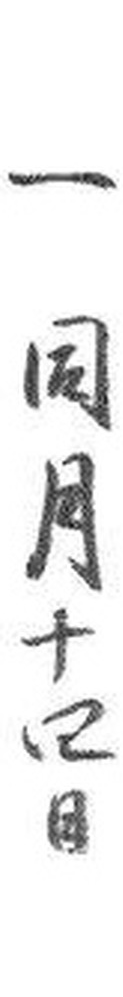一同月十四日
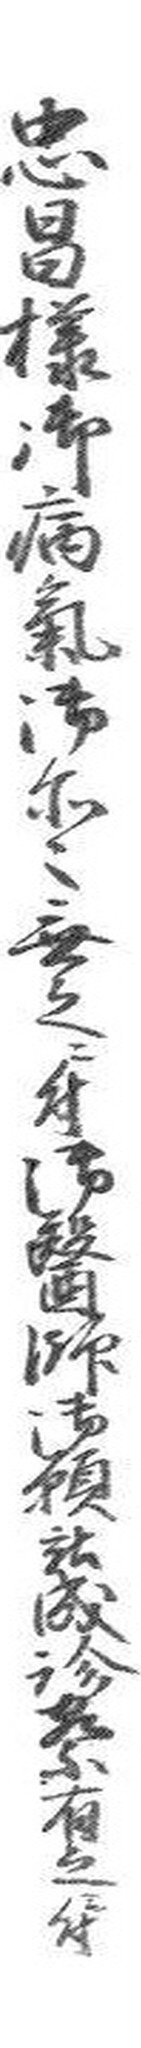忠昌様御病気御尓々無之ニ付御医師御頼被成診察有之ニ付
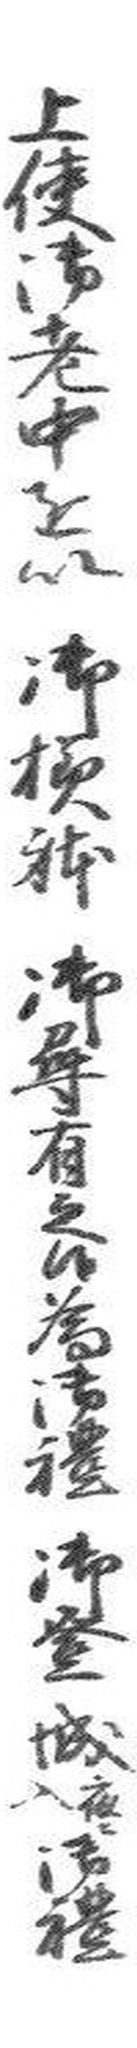上使御老中を以御様体御尋有之候為御礼御登城夜ニ入御礼
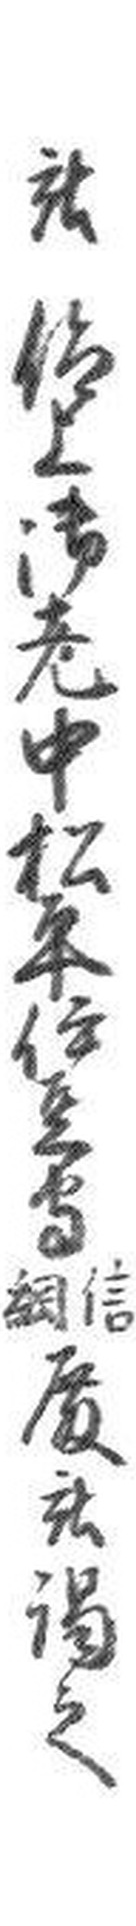被仰上御老中松平伊豆守信綱殿被謁之
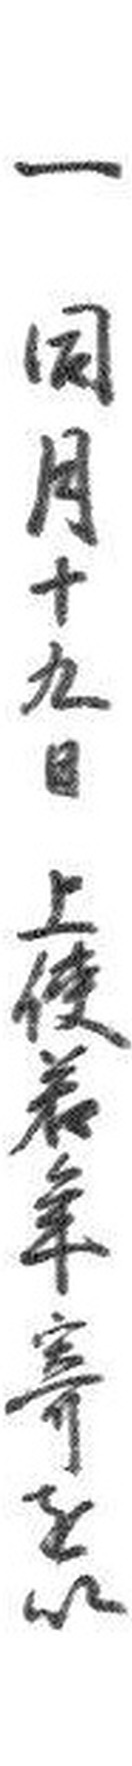一同月十九日上使若年寄を以
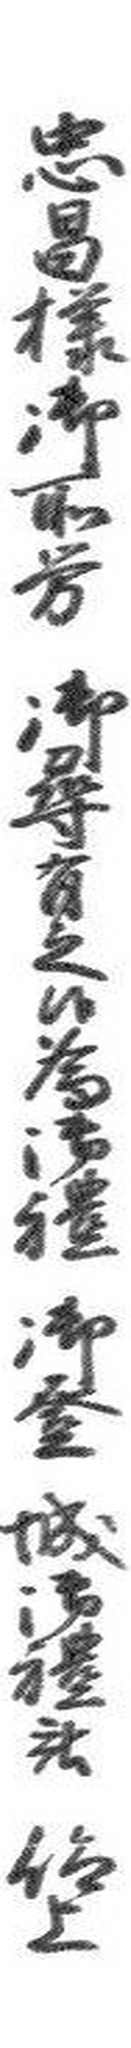忠昌様御所労御尋有之候為御礼御登城御礼被仰上
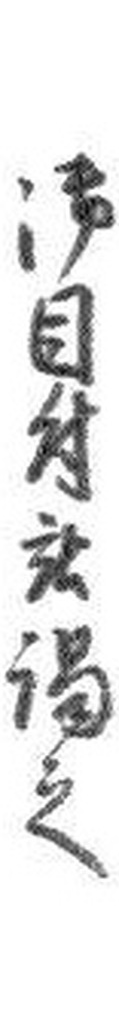御目付被謁之
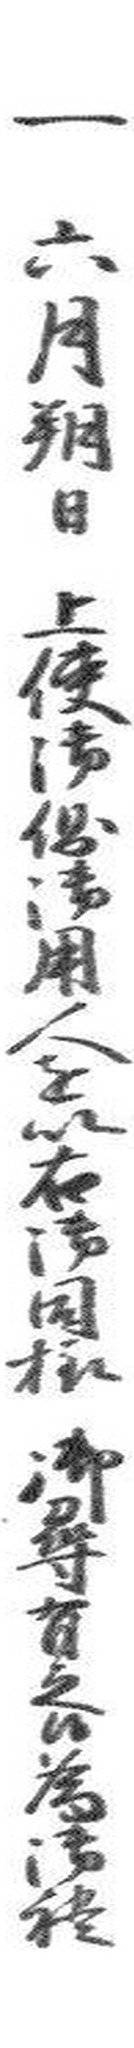一六月朔日上使御側御用人を以右御同様御尋有之候為御礼
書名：家譜 五 光通公 従寛永十三年到万治二年
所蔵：福井県文書館 Fukui Prefectural Archives
